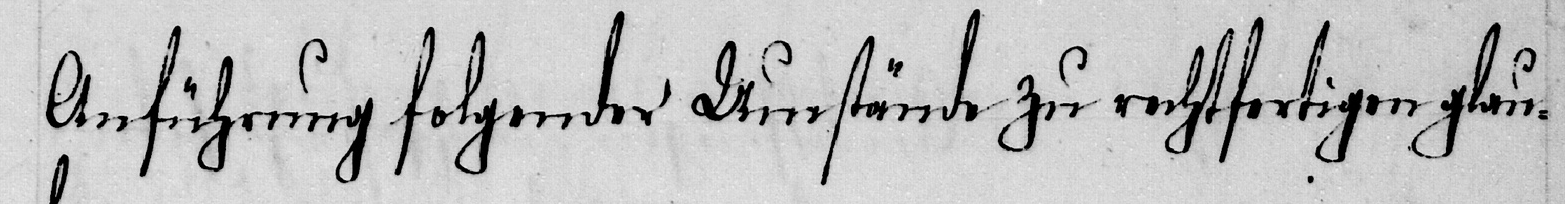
Anführung folgender Umstände zu rechtfertigen glau¬
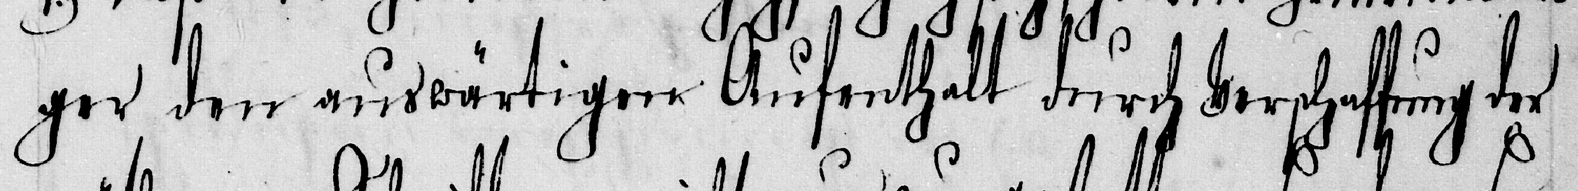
ger den auswärtigen Aufenthalt durch Verschaffung der
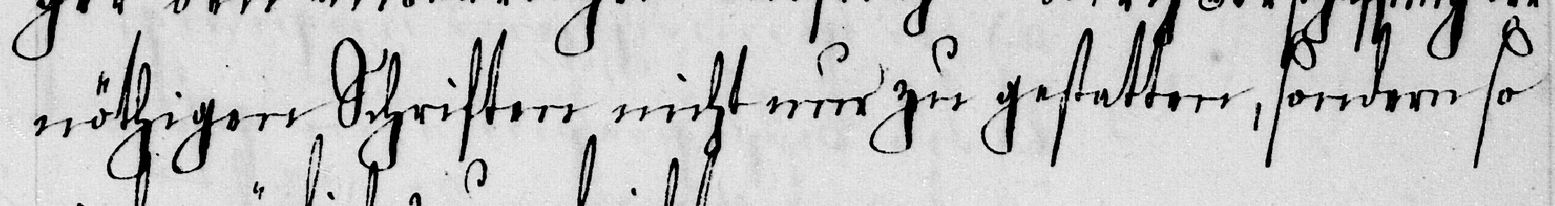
nöthigen Schriften nicht nur zu gestatten, sondern so¬
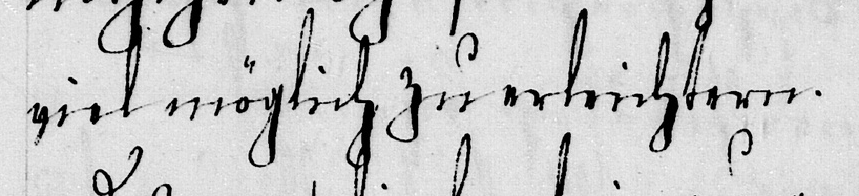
viel möglich zu erleichtern.
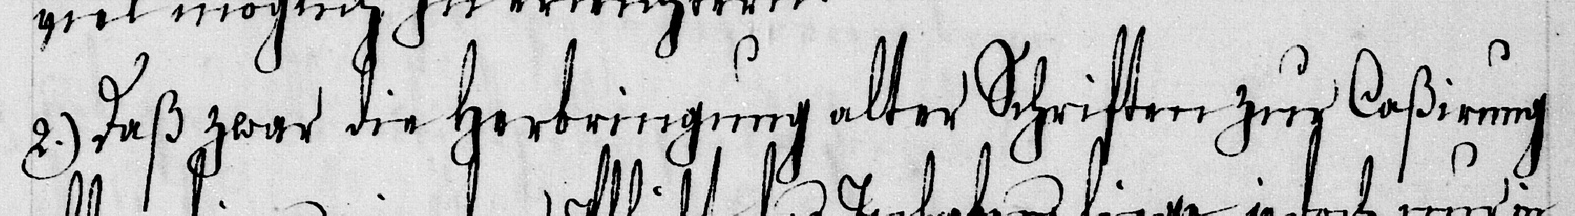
2.) Daß zwar die Herbringung alter Schriften zur Caßirung
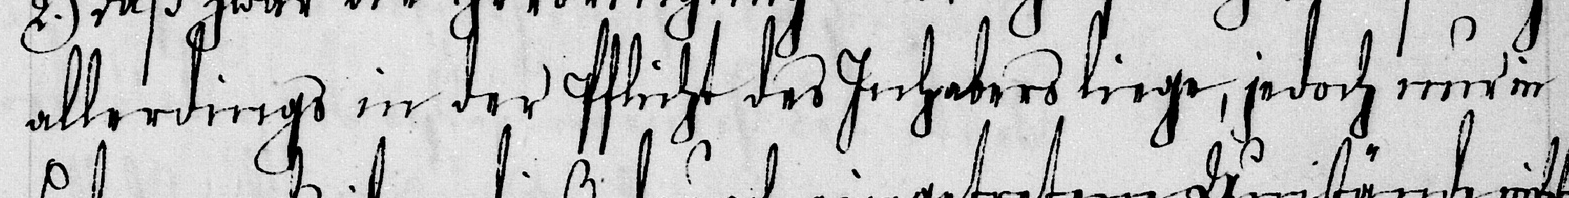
allerdings in der Pflicht des Inhabers liege, jedoch nur in
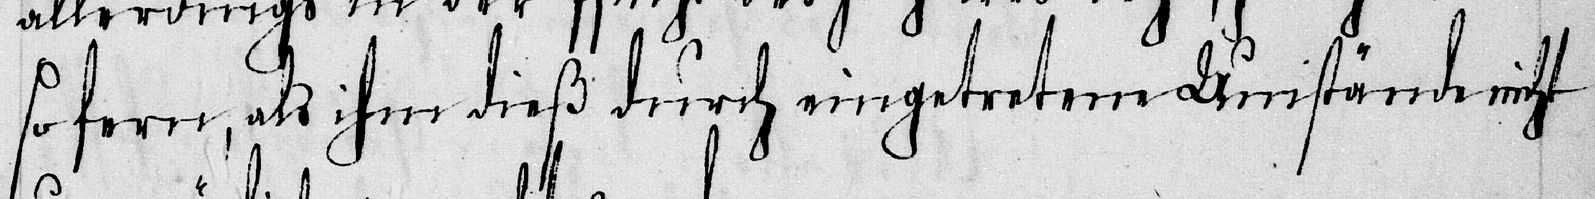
sofern, als ihm dieß durch eingetretene Umstände nicht
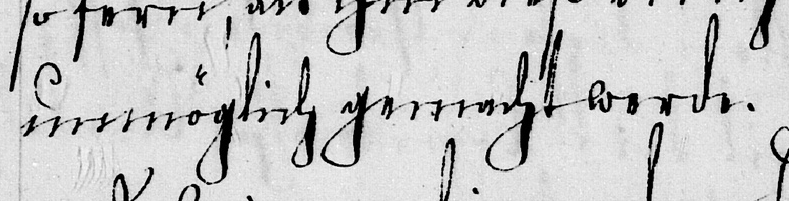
unmöglich gemacht werde.
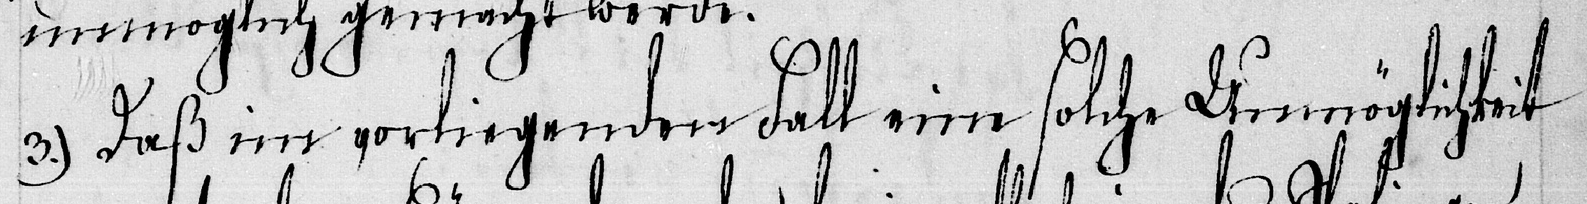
3.) Daß im vorliegenden Fall eine solche Unmöglichkeit
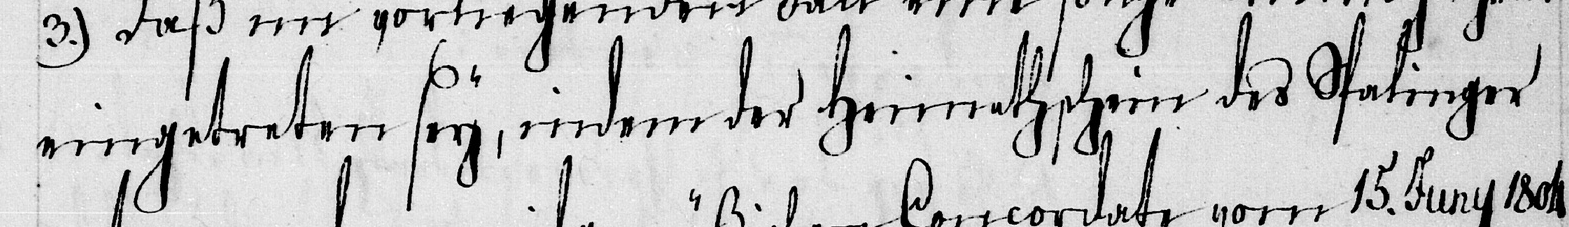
eingetreten sey, indem der Heimathschein des Spalinger
